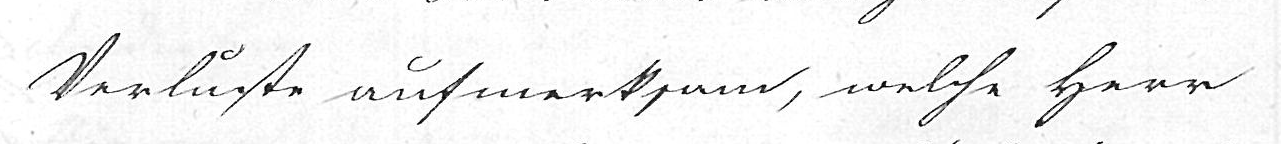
Verluste aufmerksant, welche Herr
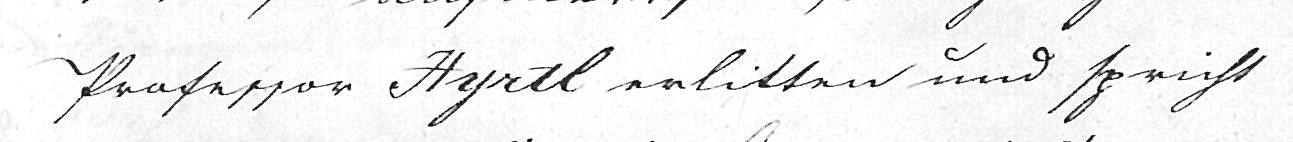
Professor Hyrtl erlitten und spricht
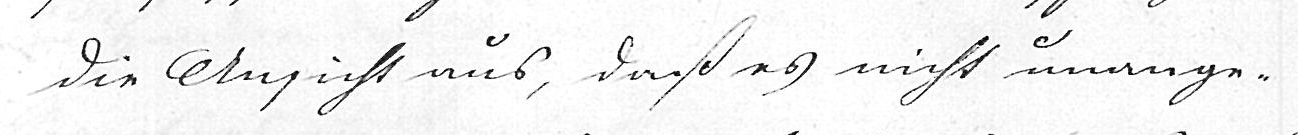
die Ansicht aus, daß es nicht unange-
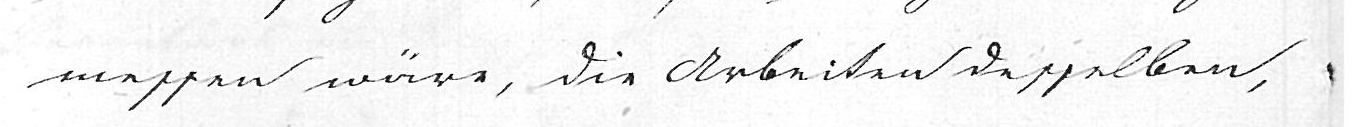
messen wäre, die Arbeiten desselben,
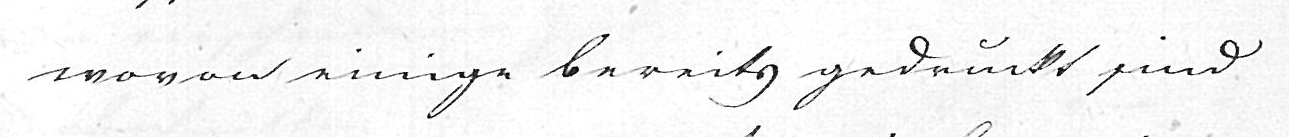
wovon eine bereits gedruckt sind
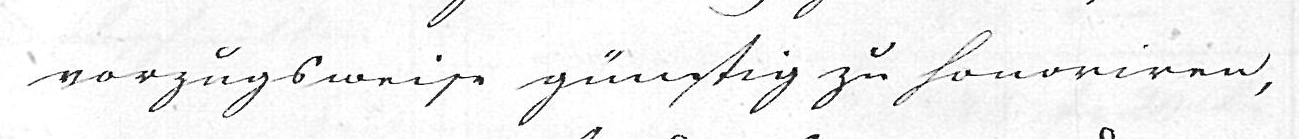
vorzugsweise günstig zu hononiren,
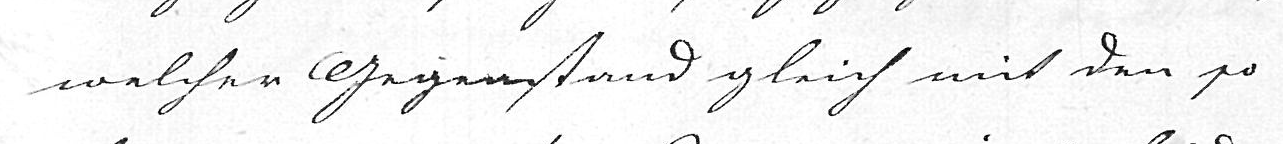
welcher Gegenstand gleich mit den so
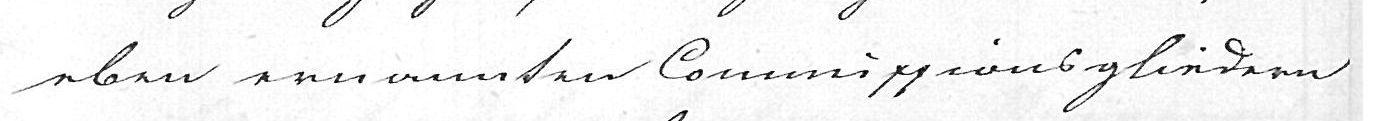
eben ernannten Commissionsgliedern
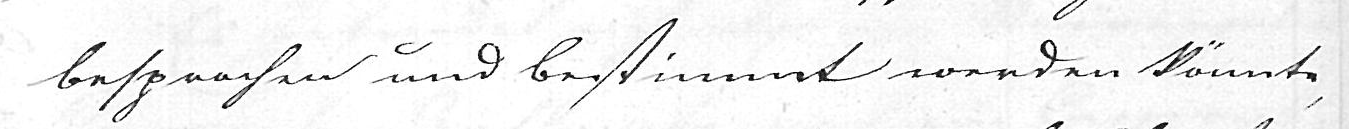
besprochen und bestimmt werden könnte,
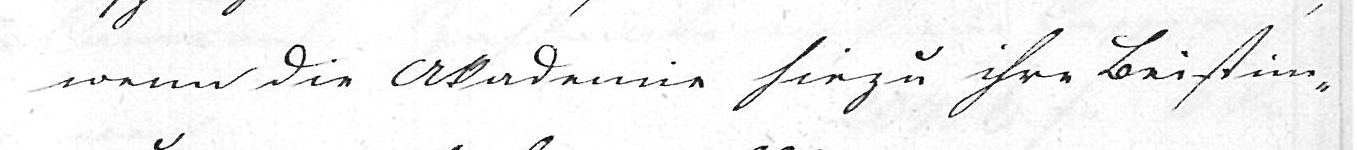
wenn die Akademie hiezu ihre Beistim-
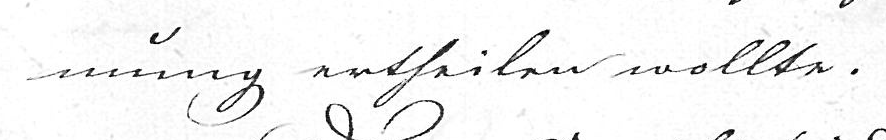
mung ertheilen wollte.
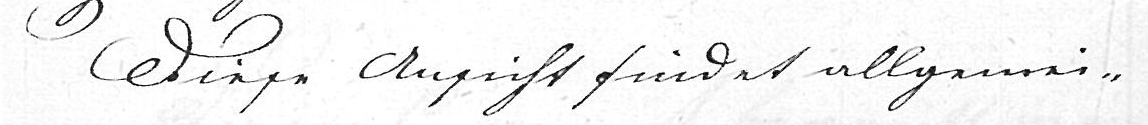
Der Ansicht findet allgemei-
